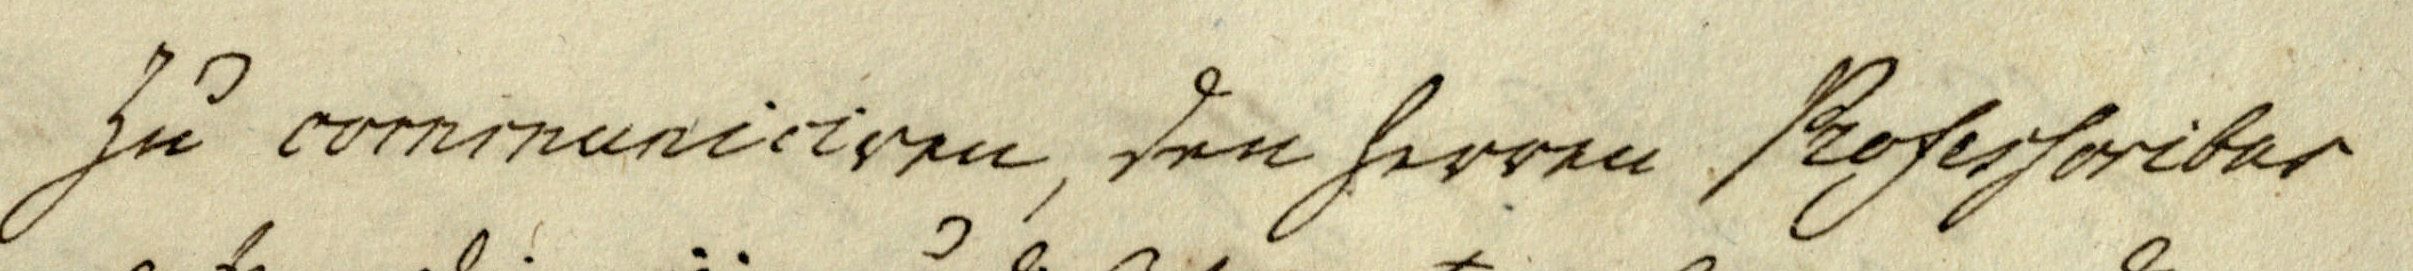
zu communiciren den Herren Professoribus
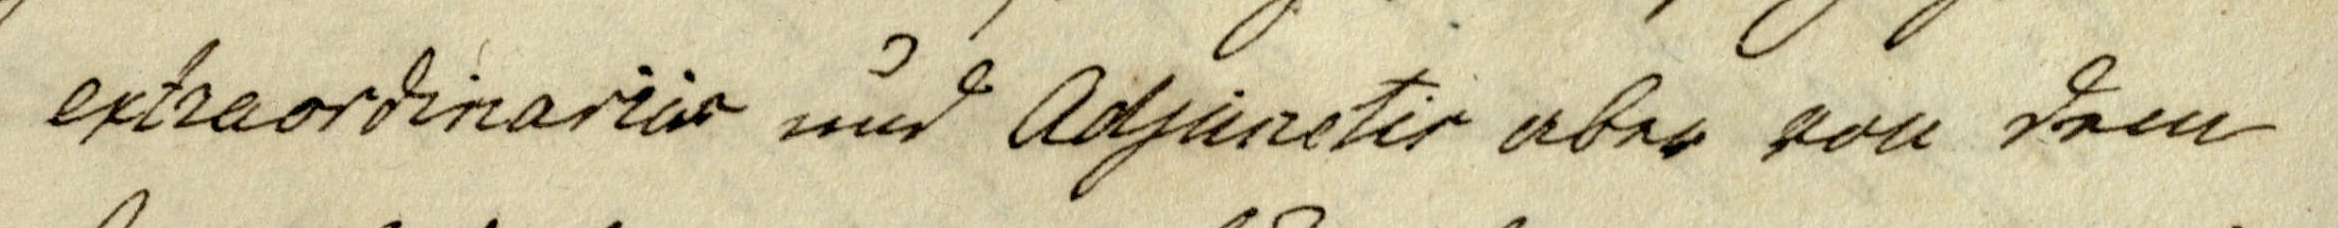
extraordinariis und Adjunctis aber von dem
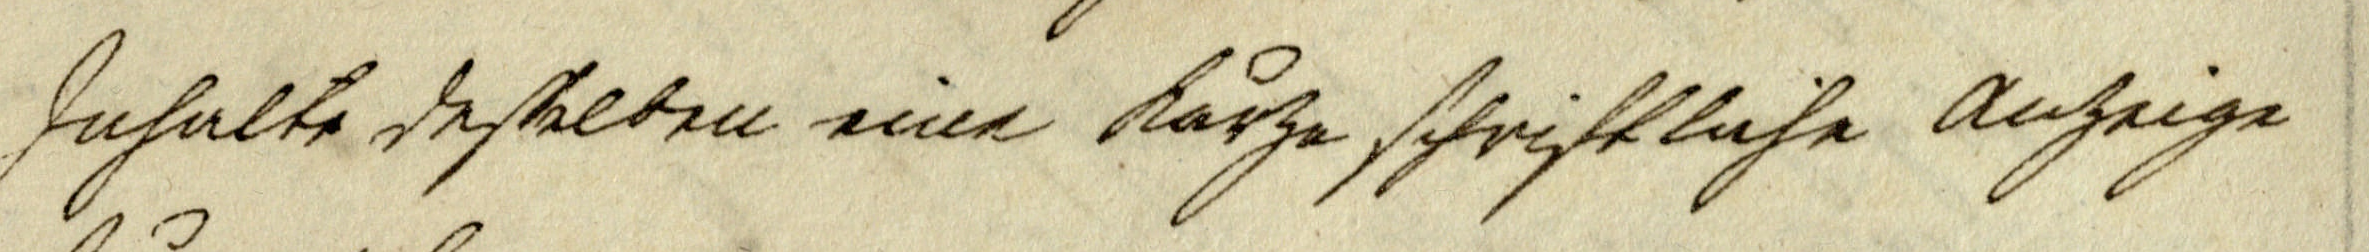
Inhalte desselben eine kurze schriftliche Anzeige
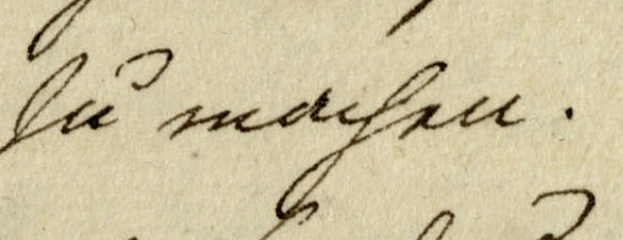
zu machen.
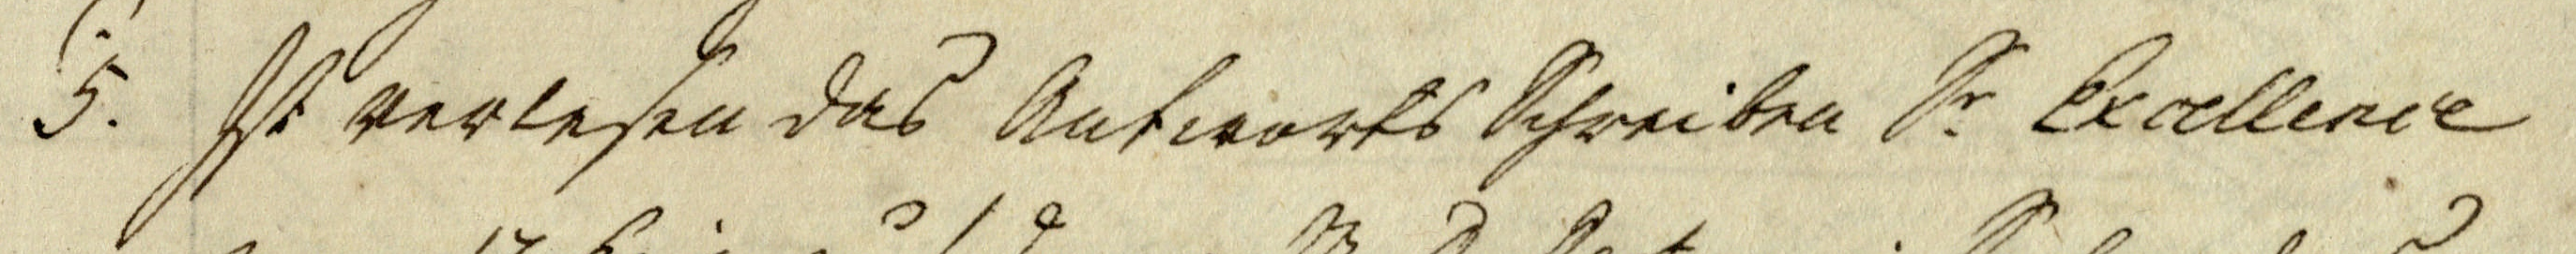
5. Ist verlesen das Antworts Schreiben Sr Excellence
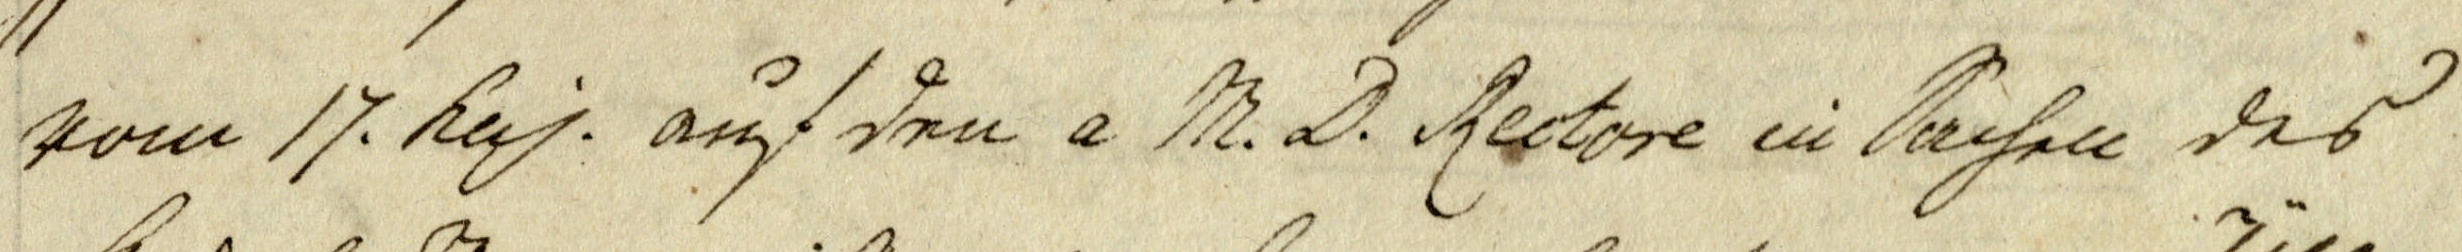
vom 17. huj. auf den a M. D. Rectore in Sachen des
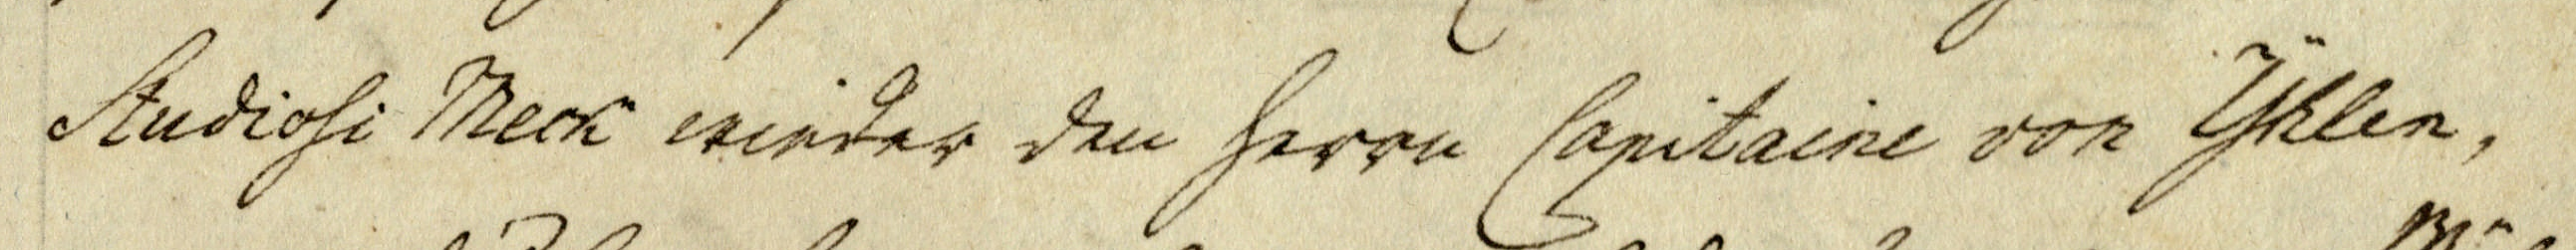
Studiosi Meck wieder den Herrn Capitaine von Ÿhlen,
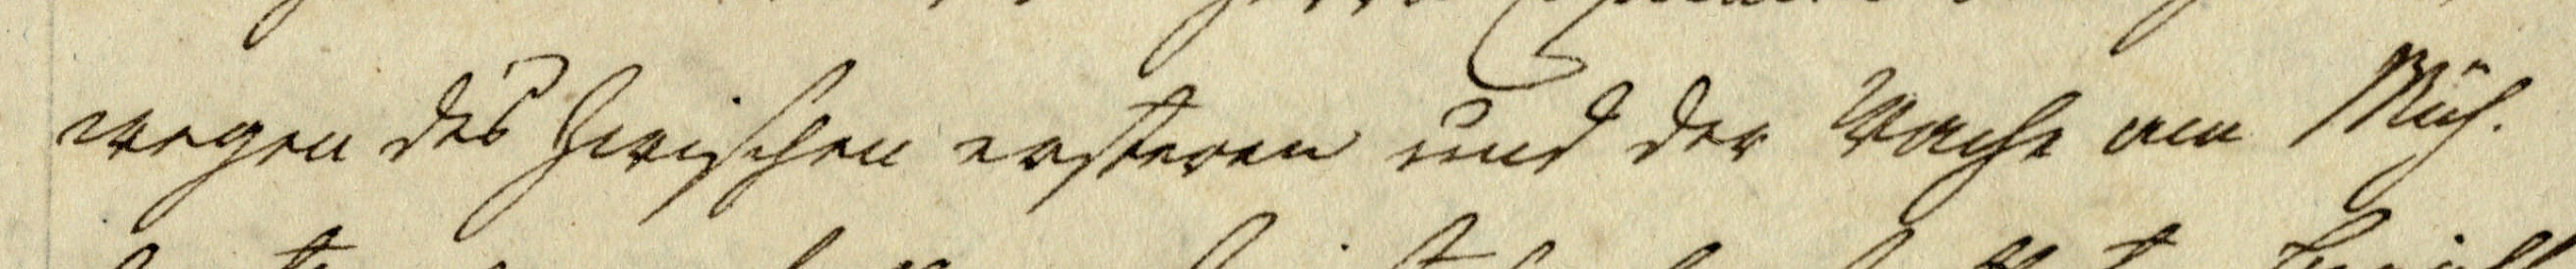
wegen des zwischen ersteren und der Wache am Müh¬
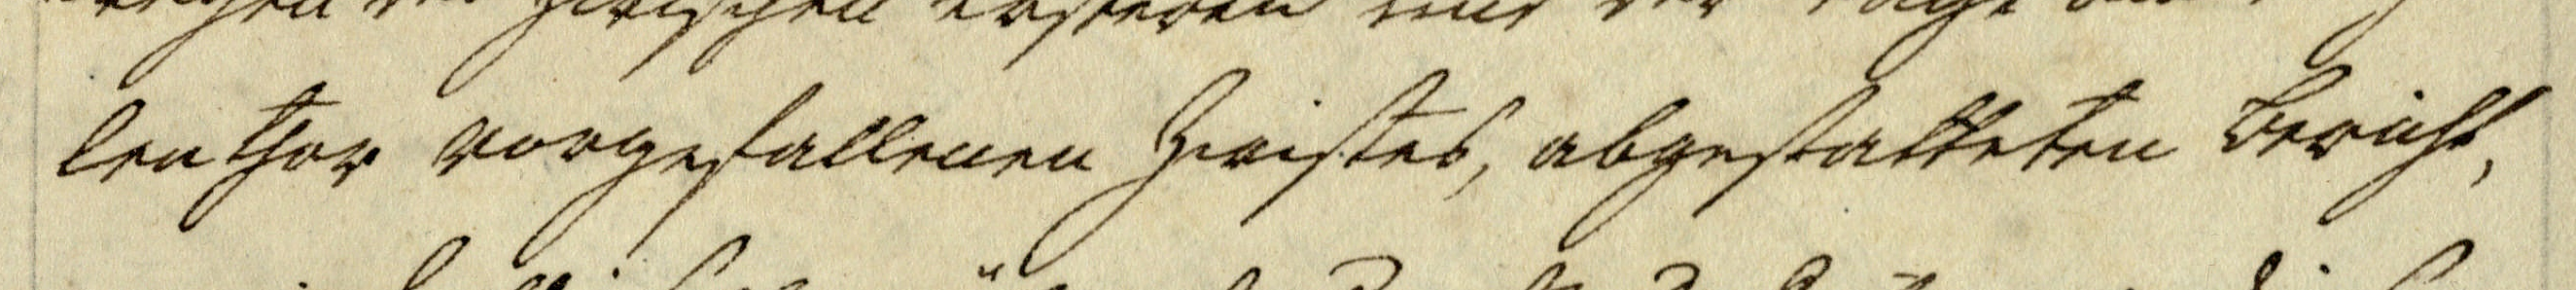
lenthor vorgefallenen Zwistes, abgestatteten Bericht
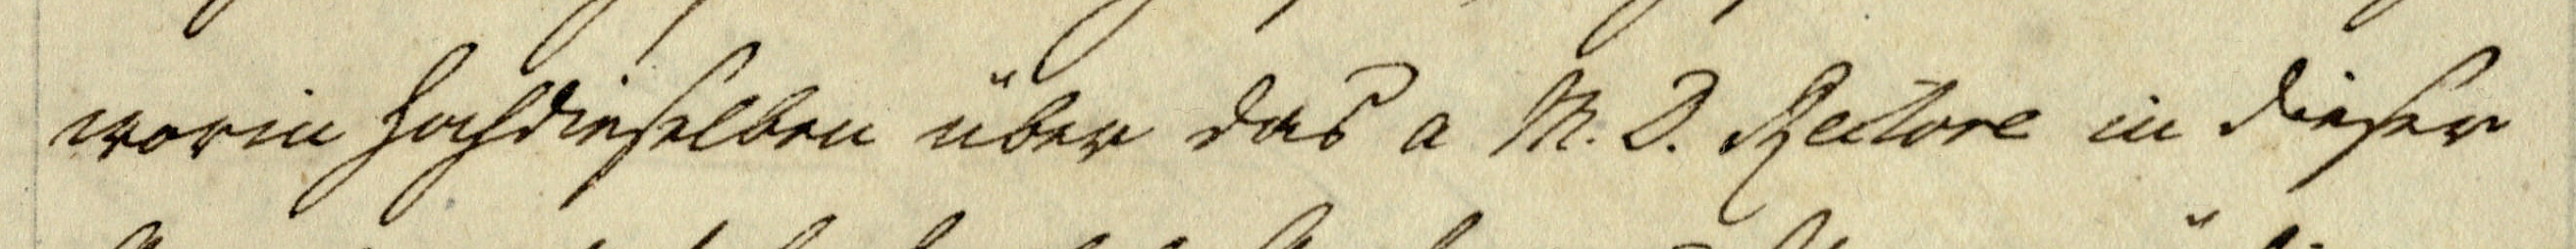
worin Hochdieselben über das a M. D. Rectore in dieser
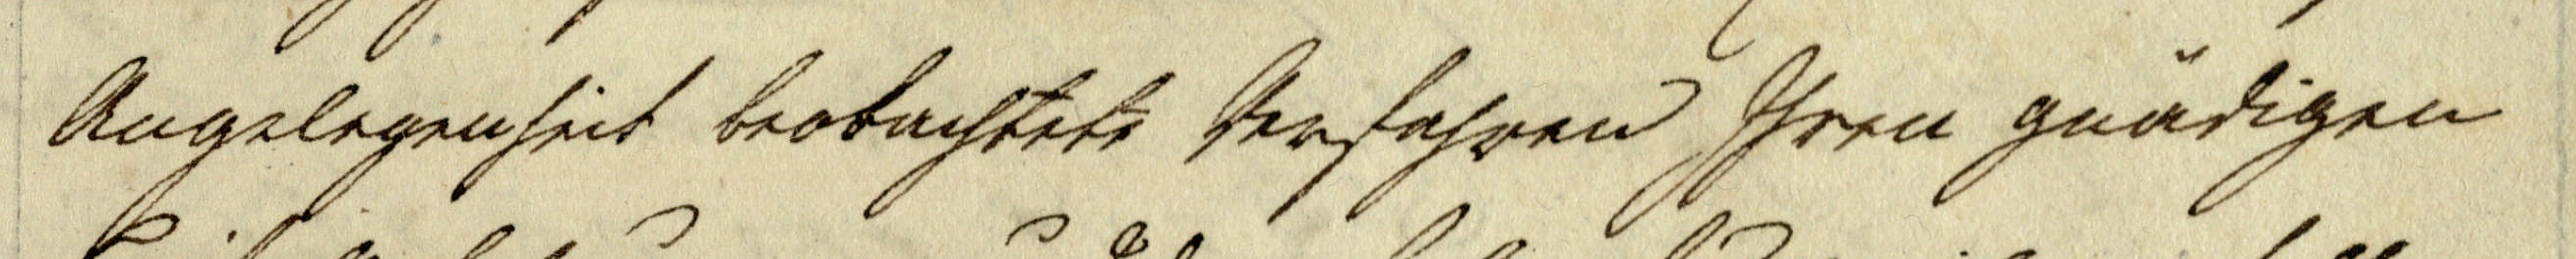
Angelegenheit beobachtete Verfahren Ihren gnädigen
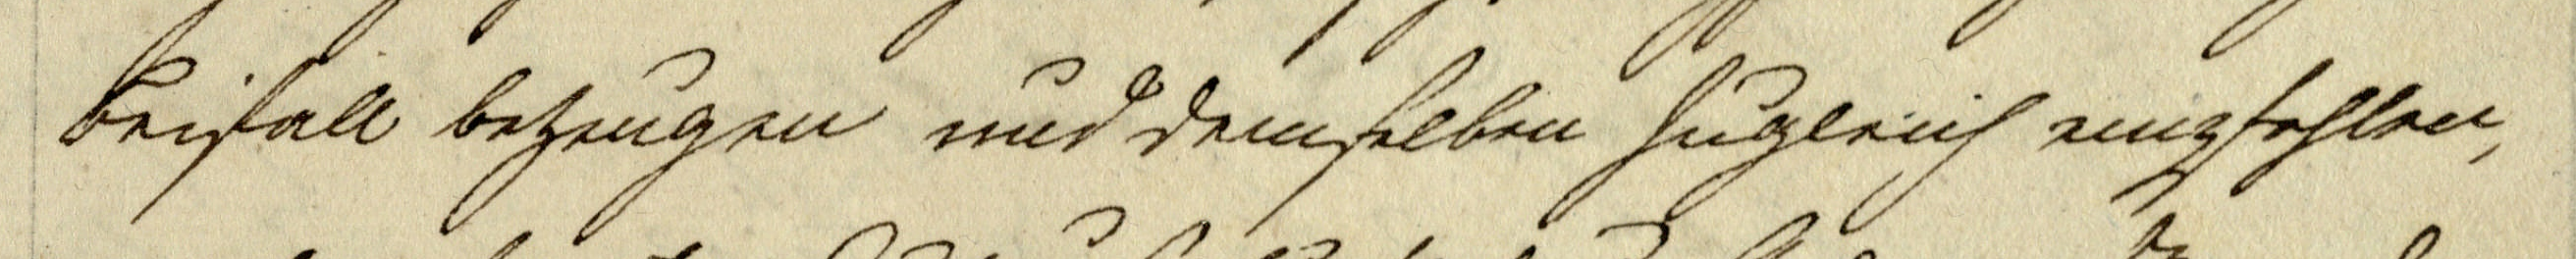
Beifall bezeugen und demselben zugleich empfehlen,
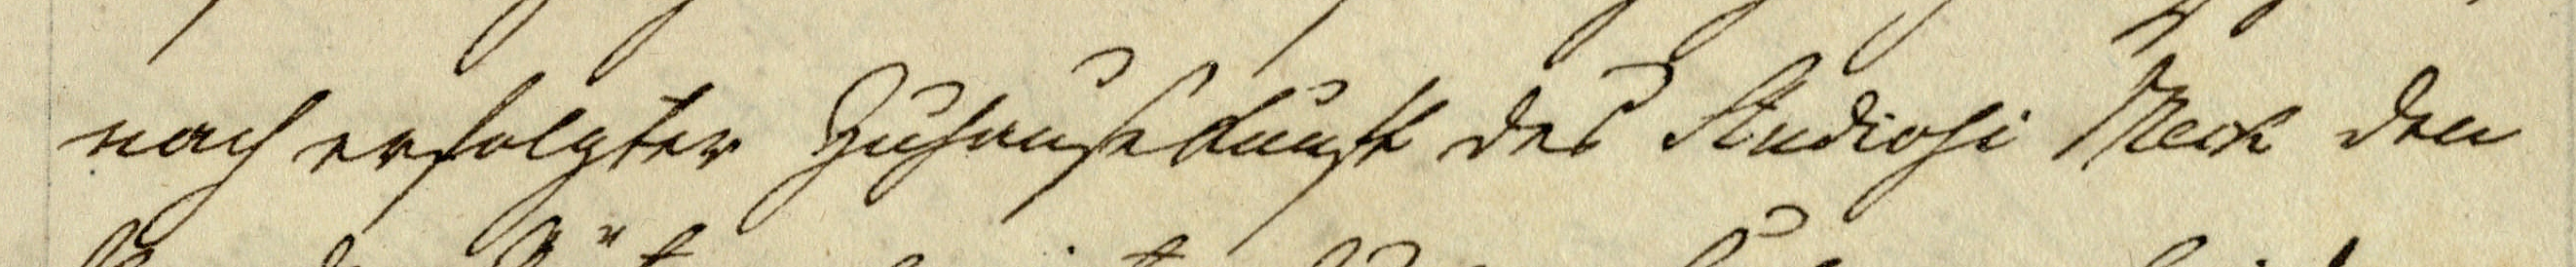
nach erfolgter Zuhausekunft der Studiosi Meck den
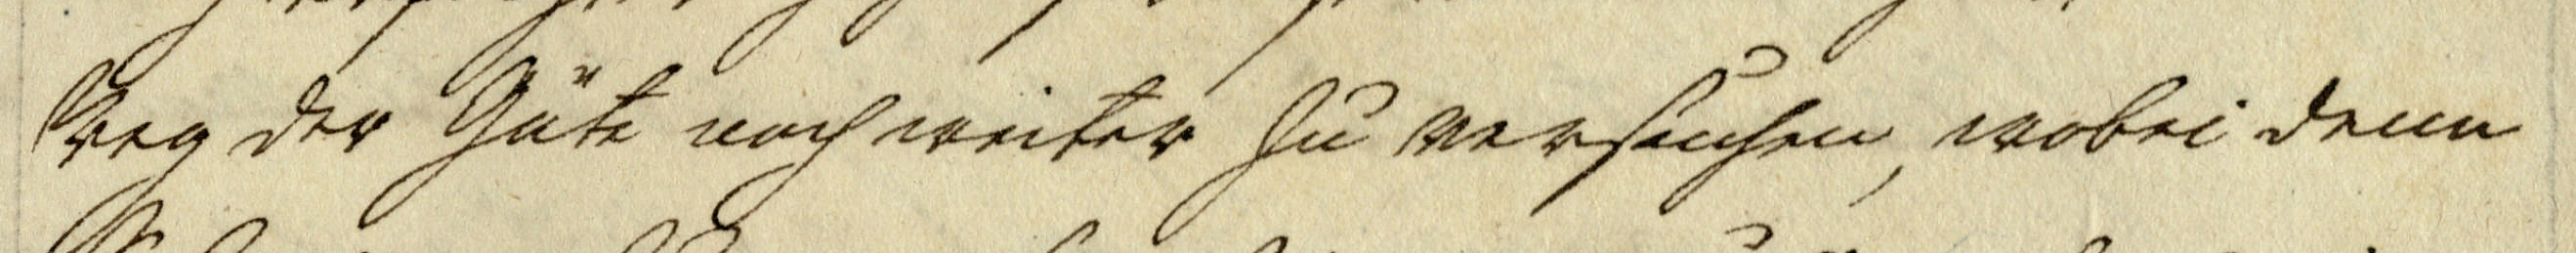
Weg der Güte noch weiter zu versuchen, wobei denn
